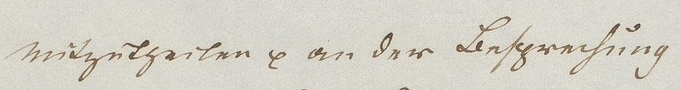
mitzutheilen & an der Besprechung
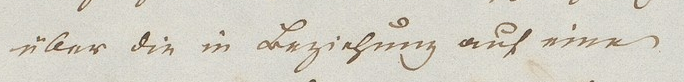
über die in Beziehung auf eine
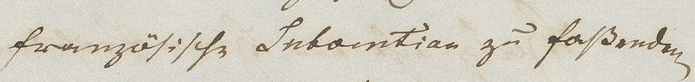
französische Subvention zu faßenden
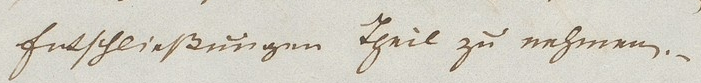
Entschließungen Theil zu nehmen. –
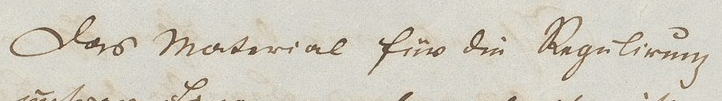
Das Material für die Regulirung
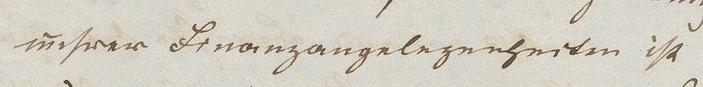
unsrer Finanzangelegenheiten ist
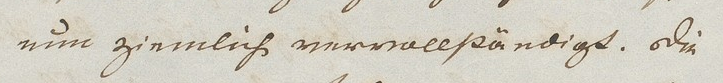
nun ziemlich vervollständigt. Die
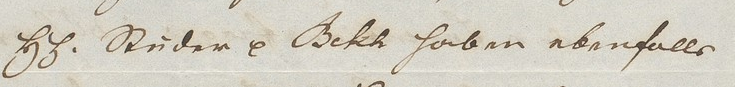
HH. Studer & Bekh haben ebenfalls
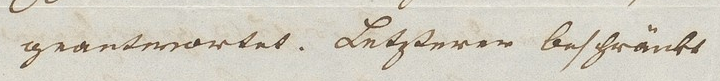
geantwortet. Letzterer beschränkt
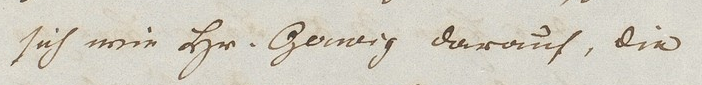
sich wie Hr. Gerwig darauf, die
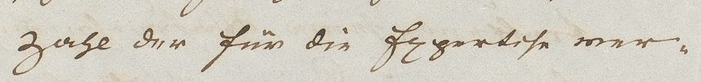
Zahl der für die Expertise ver-
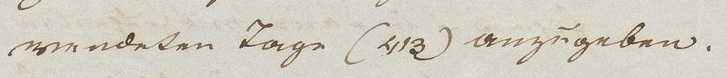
wendeten Tage (413) anzugeben.
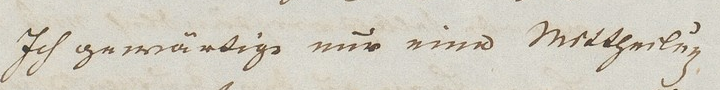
Ich gewärtige nur eine Mittheilung
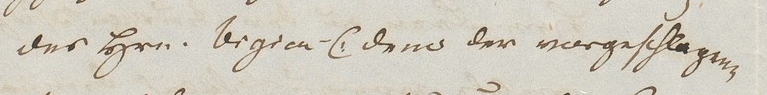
des Hrn. Vigier (: dem der vorgeschlagene
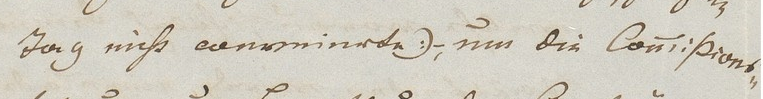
Tag nicht convenirte: )-, um die Commißions-
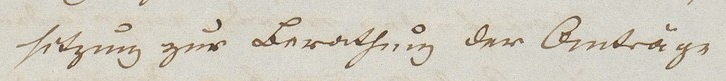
sitzung zur Berathung der Anträge
